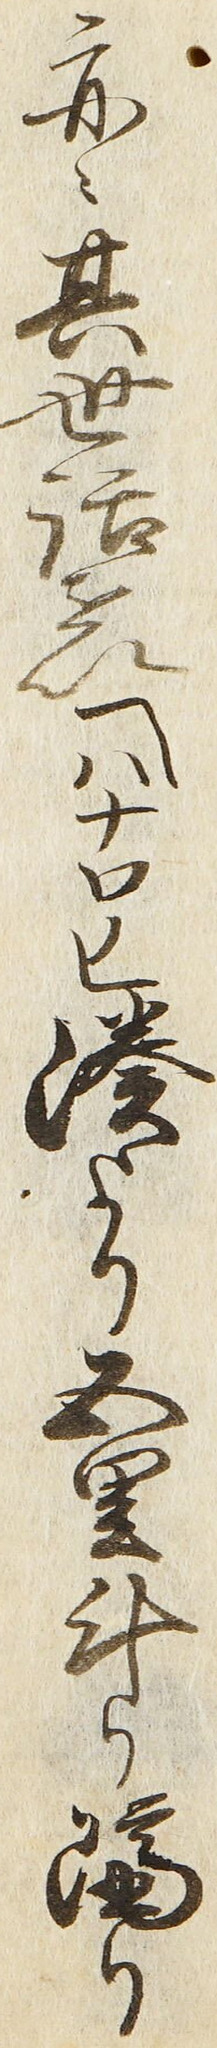亦々其世話を以「ハナロノ」湊より五里斗り隔り
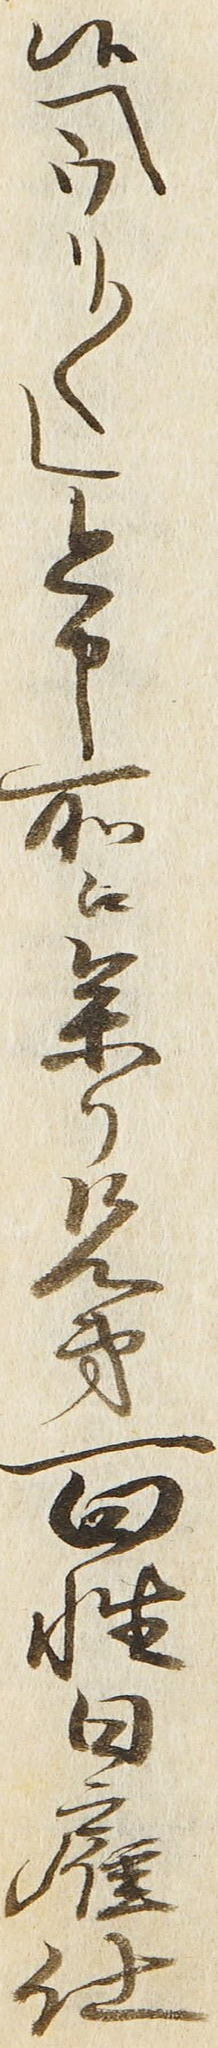候「ウリ〳〵」と申所江参り兄弟百姓日雇仕
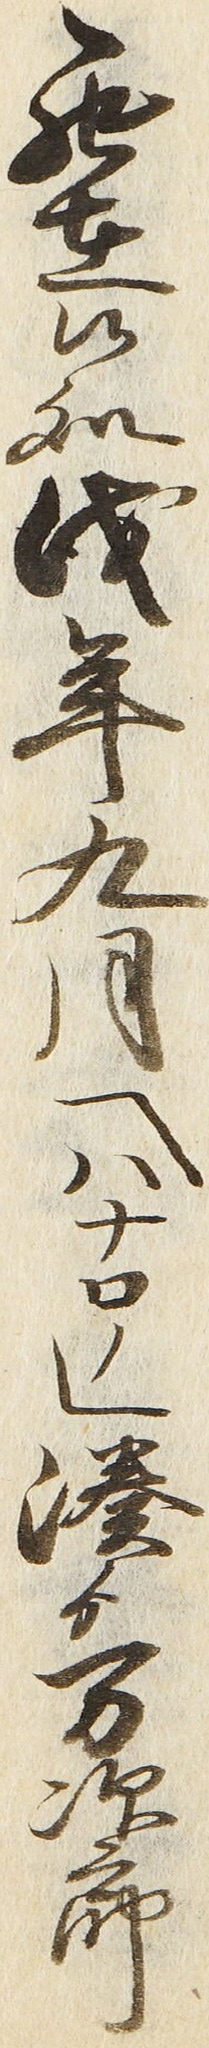罷在候処戌年九月「ハナロノ」湊ゟ万次郎
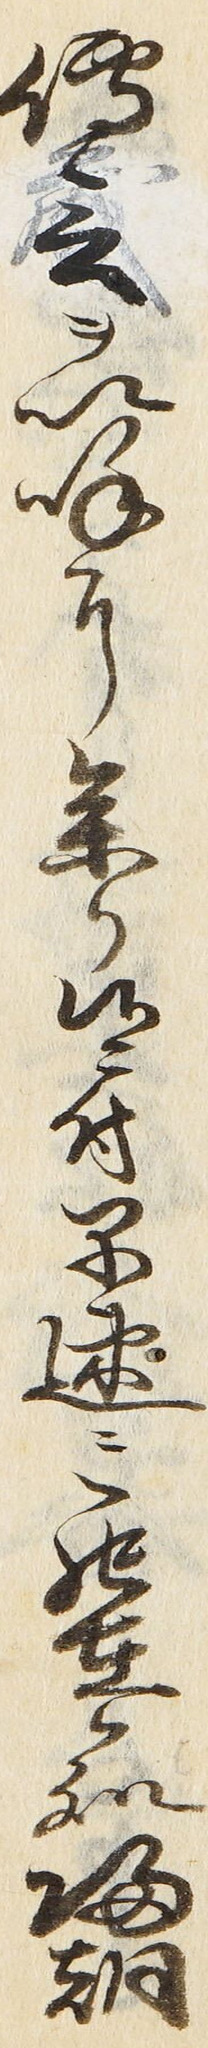傳言ヲ以呼に参り候ニ付早速罷在候処帰朝
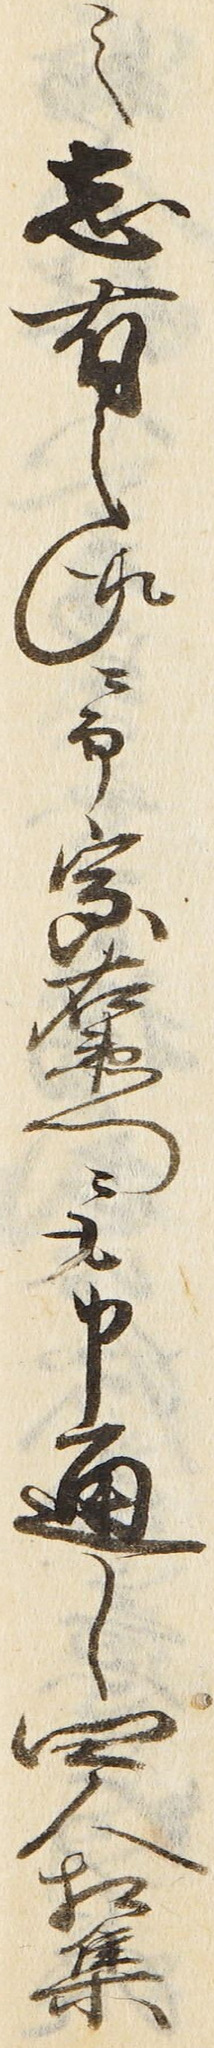之志有之趣ニ而寅右衛門ニも申通し四人相集
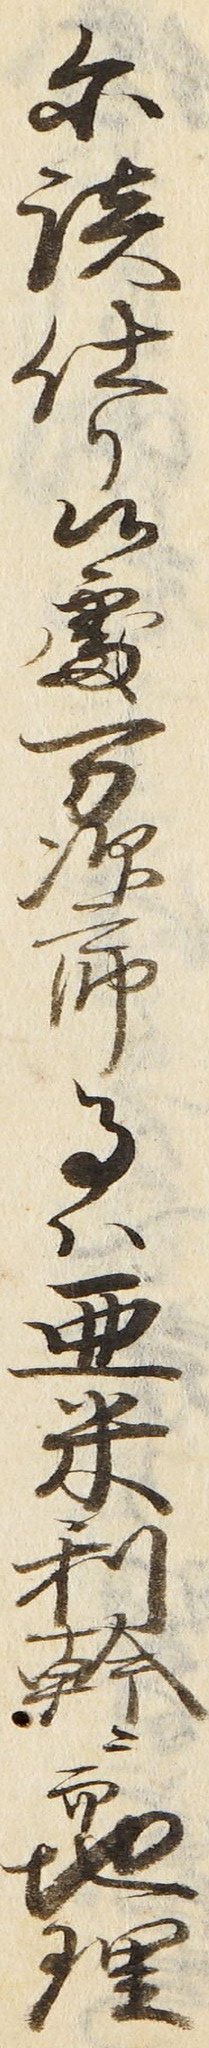示談仕り候處万次郎事ハ亜米利幹ニ而地理
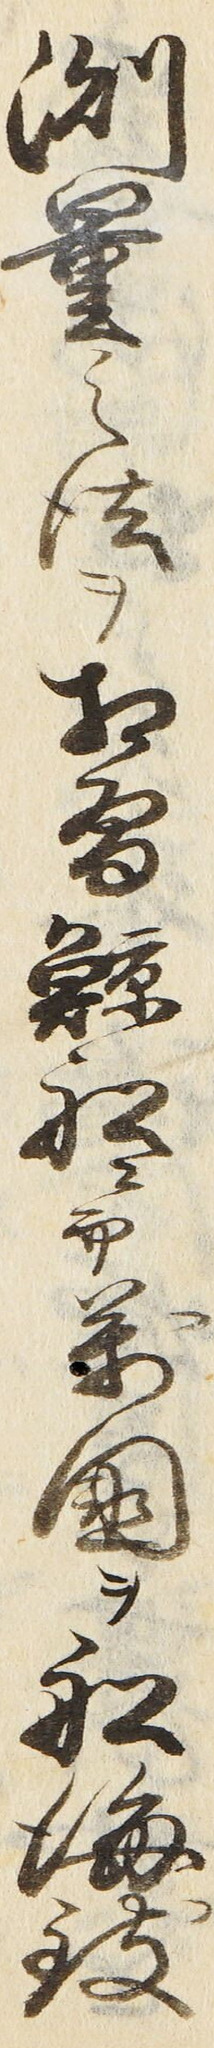測量之法ヲ相習鯨舩ニ而萬国ヲ舩海致
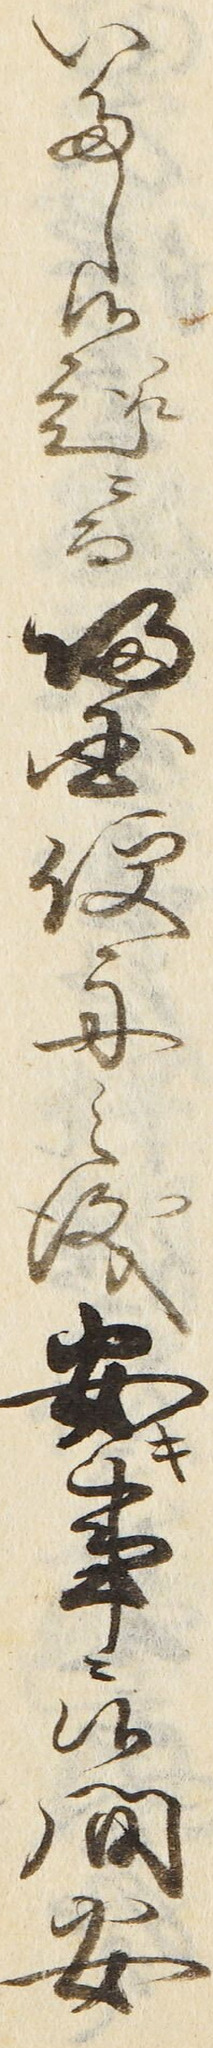いたし候趣ニ而帰国便舟乃之儀安キ事ニ候間安
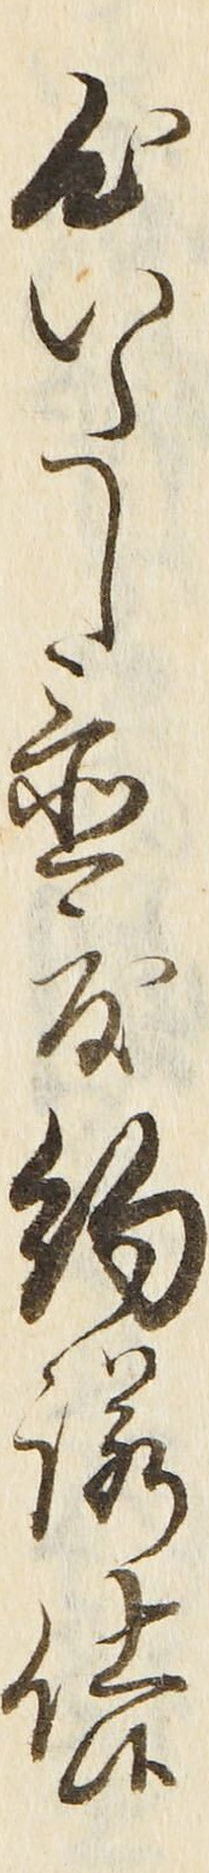心いたし置度約諾仕候
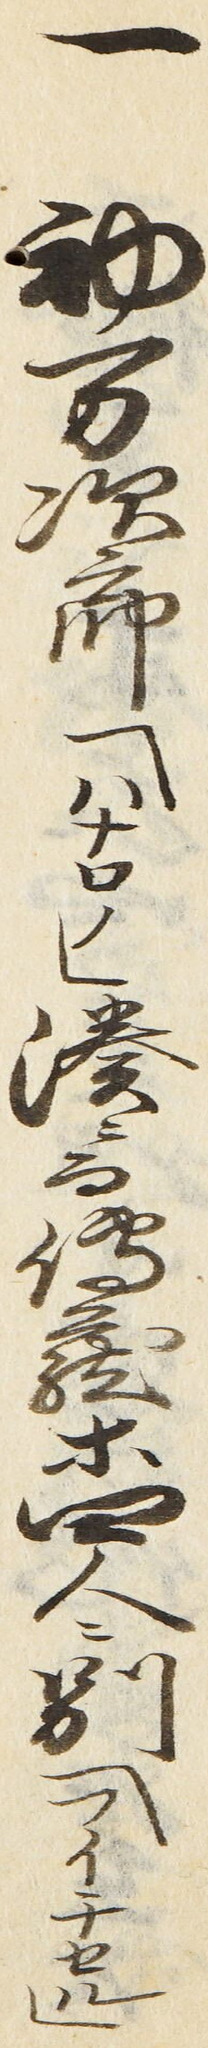一初万次郎「ハナロノ」湊ニ而傳蔵等四人ニ別「フイチセル」
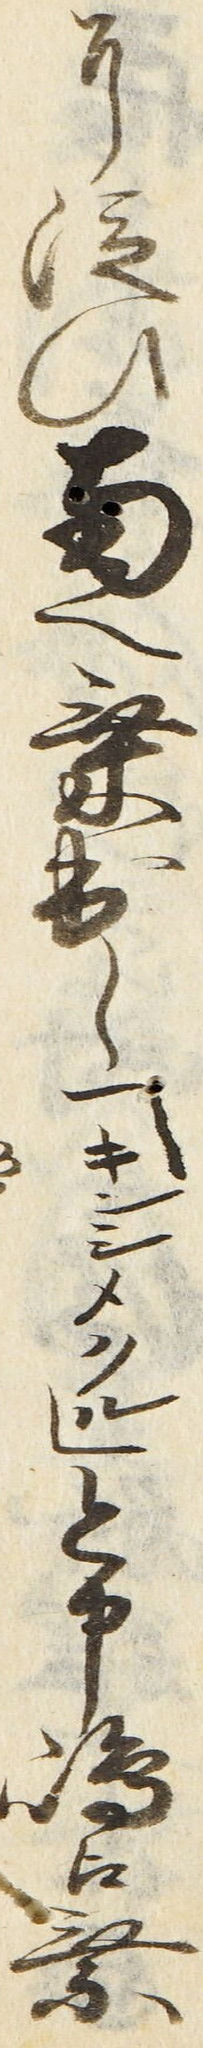に従ひ南へ乗出し「キンシメクル」と申嶋江乗
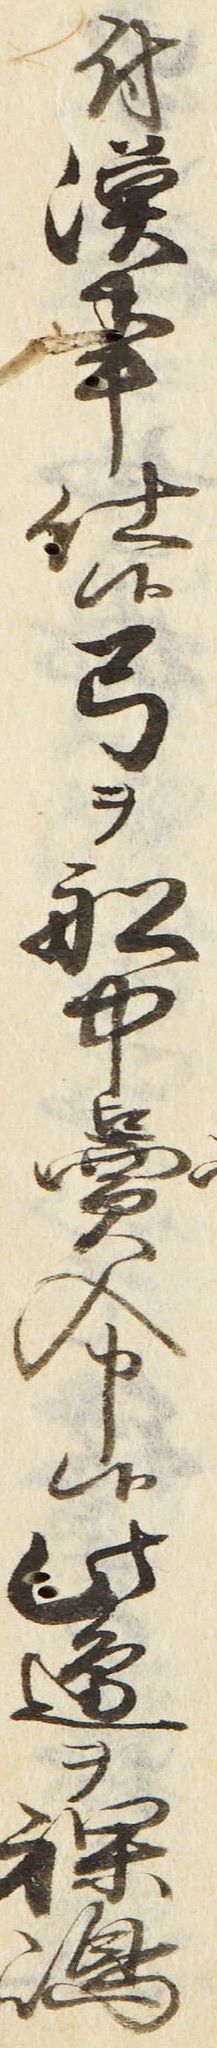付漁事仕候弓ヲ舩中賈入申候此邊ヲ裸嶋
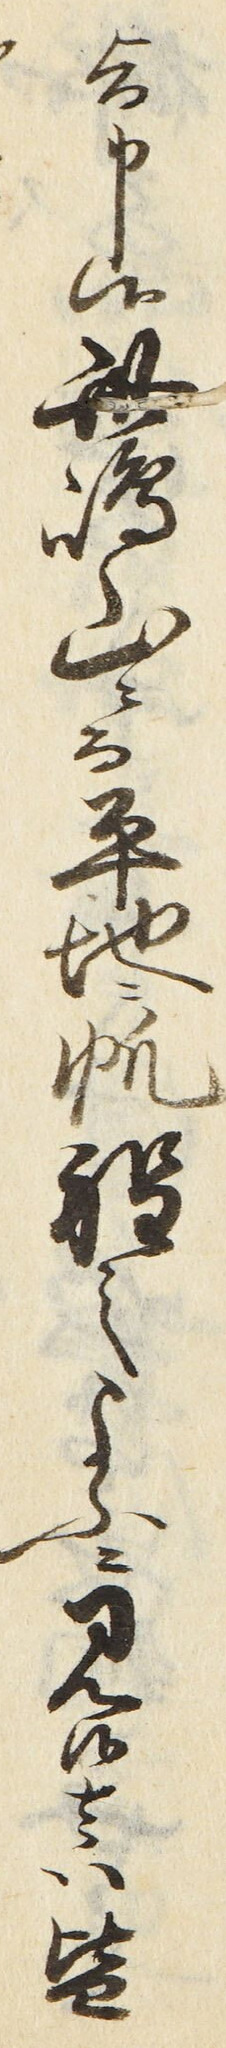と申候此嶋山ニ而平地ニ帆程之よふニ見候者ハ皆
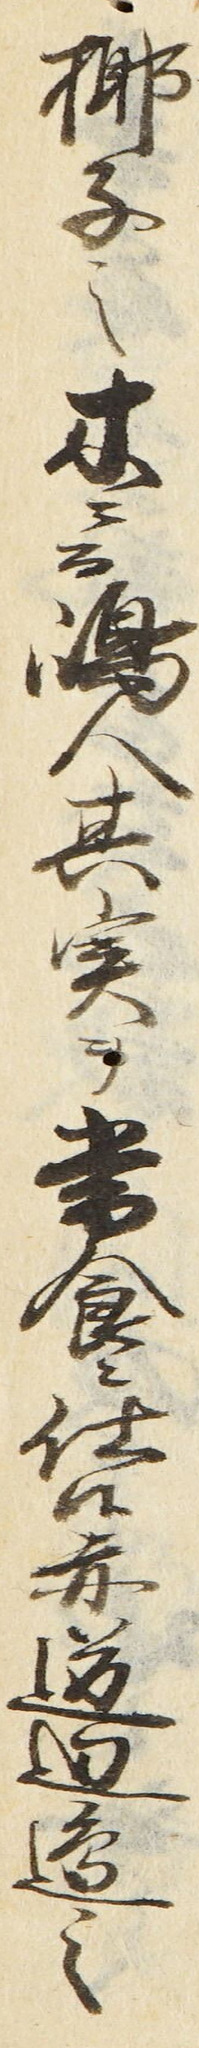椰子之木ニ而嶋人其実ヲ常食ニ仕候赤道辺邊之

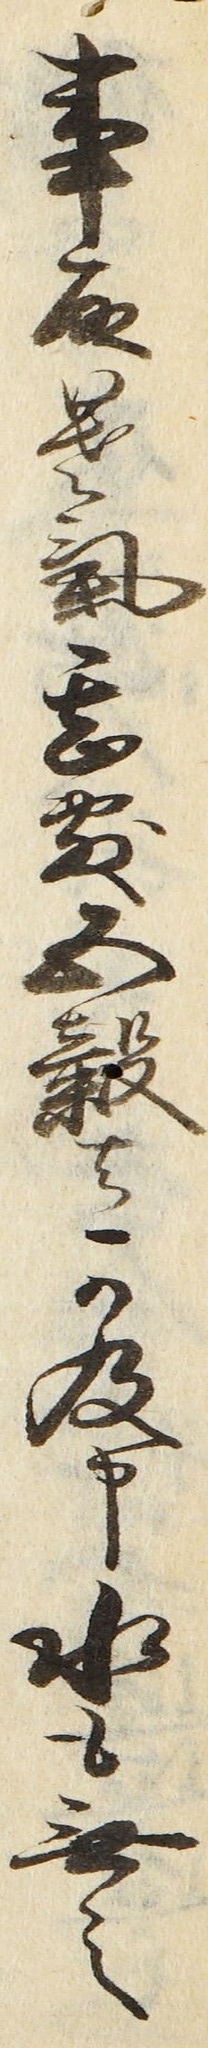事故暑氣甚敷五穀者可及申水も無之
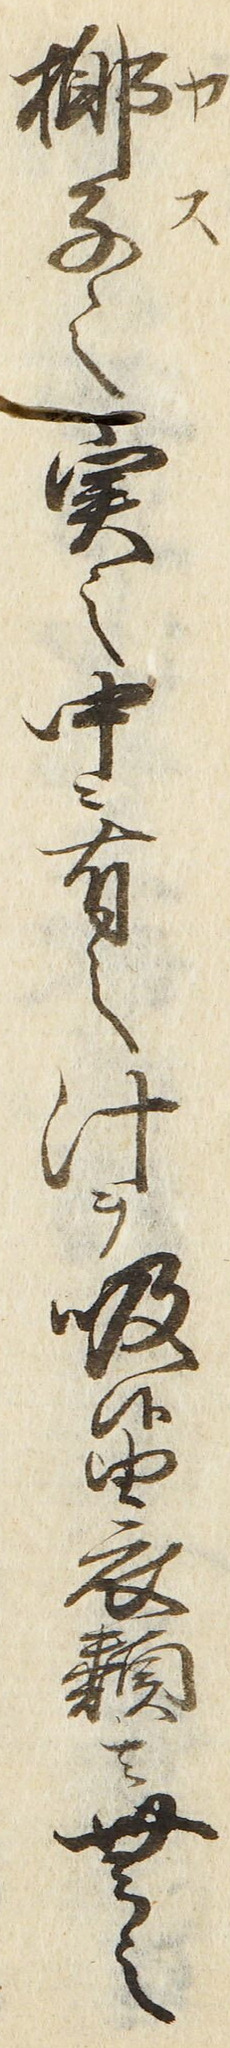椰子之実之中ニ有之汁ヲ吸候由衣類者無之
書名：漂客談寄
